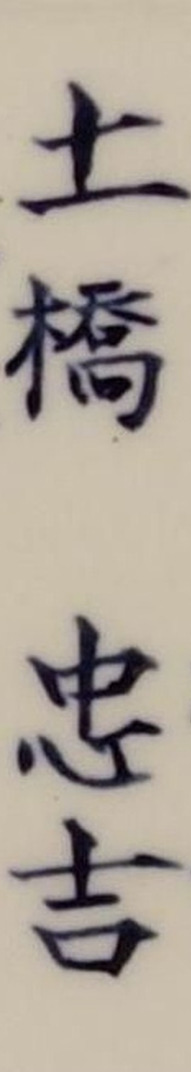土橋忠吉
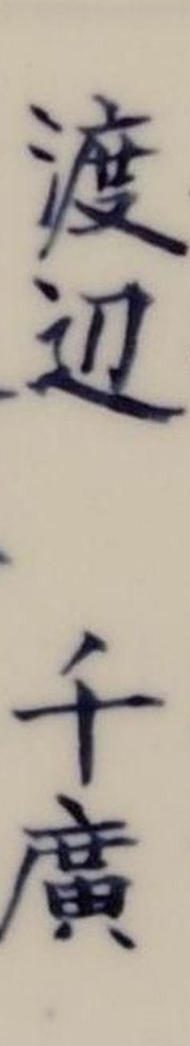渡辺千広
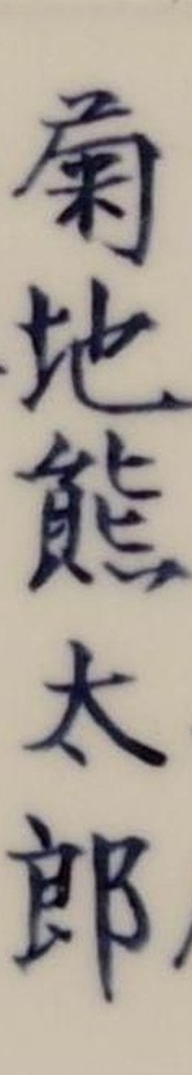菊地熊太郎
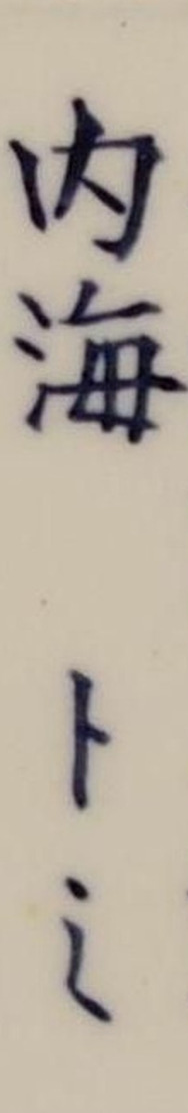内海トミ
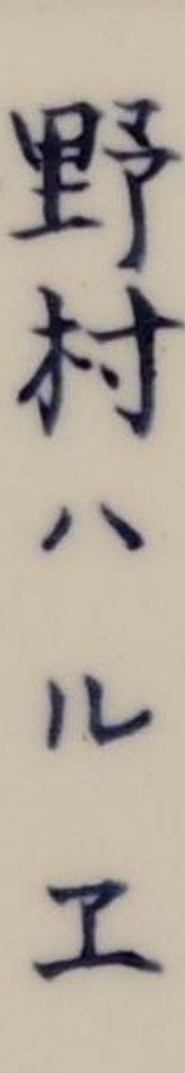野村ハルヱ
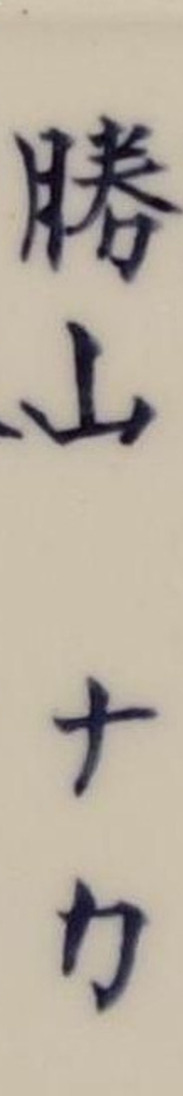勝山ナカ
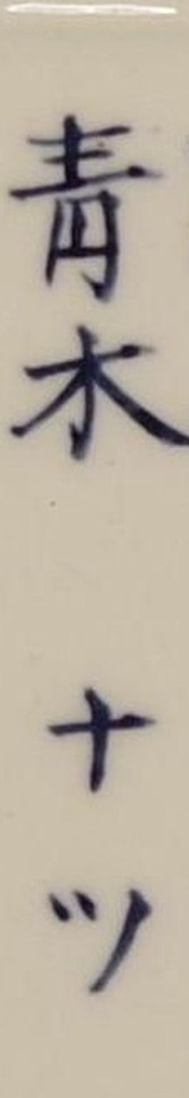青木ナツ
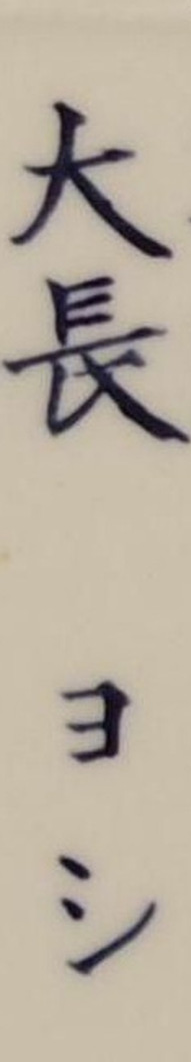大長ヨシ
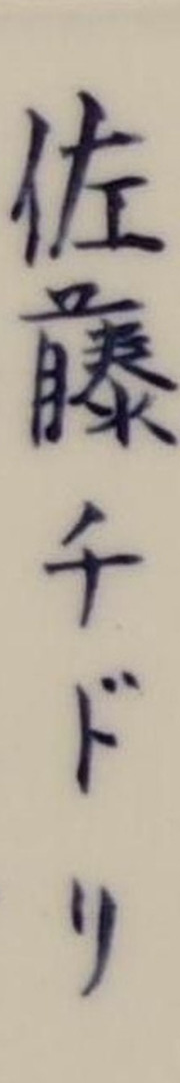佐藤チドリ
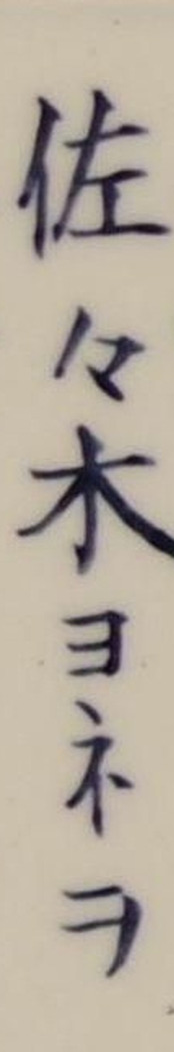佐々木ヨネヲ
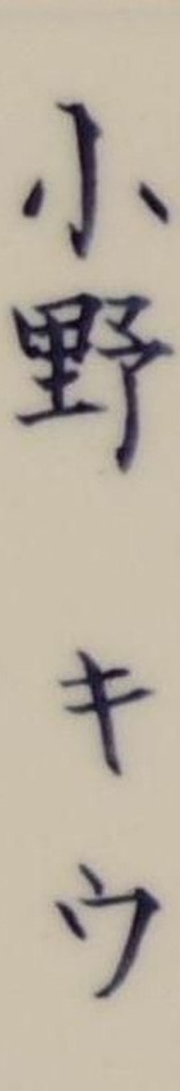小野キウ
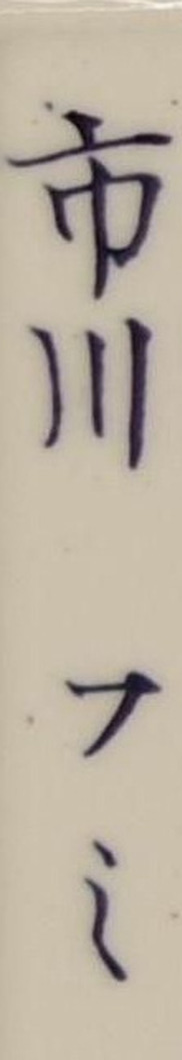市川フミ

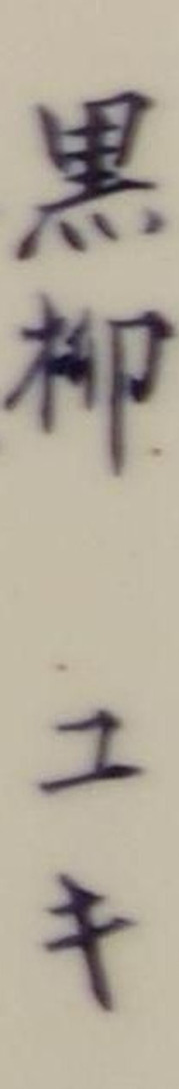黒柳ユキ
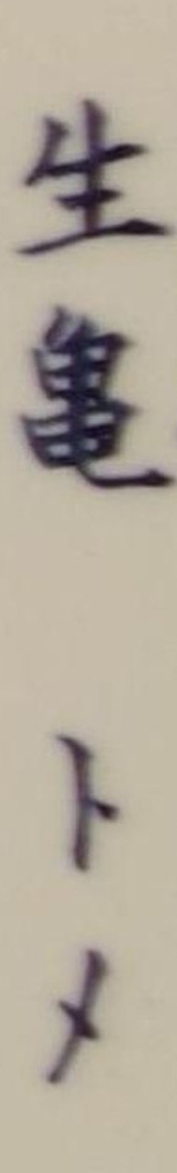生亀トメ
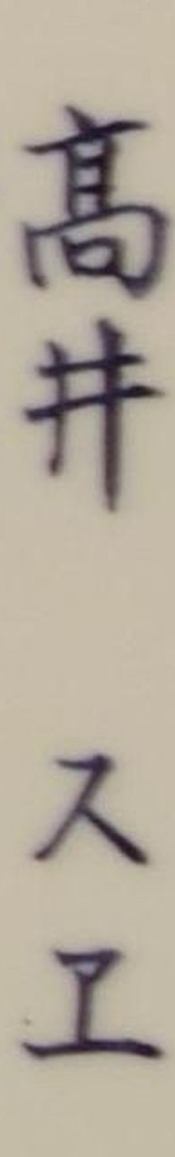高井スヱ
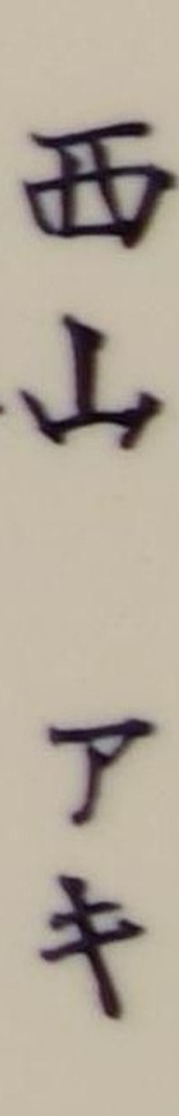西山アキ
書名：E~L
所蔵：高野山金剛峯寺
